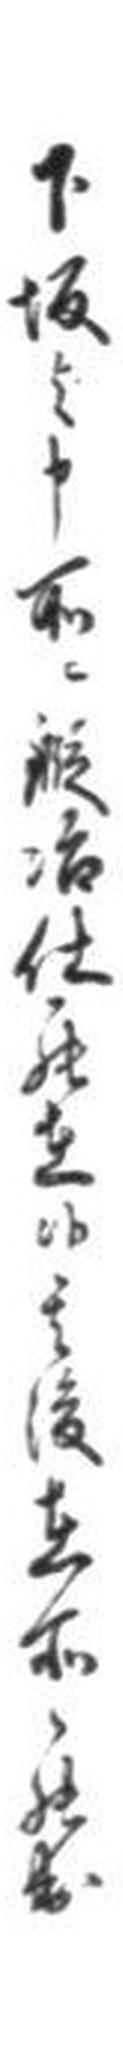下坂与申所ニ鍛冶仕罷在候其後在所へ罷出
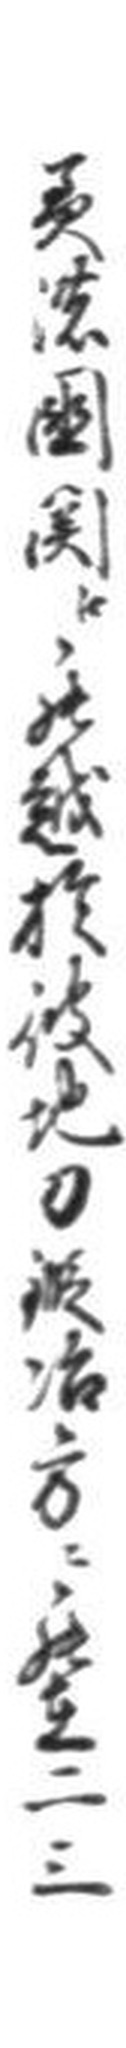美濃国関江罷越於彼地刀鍛冶方ニ罷在二三
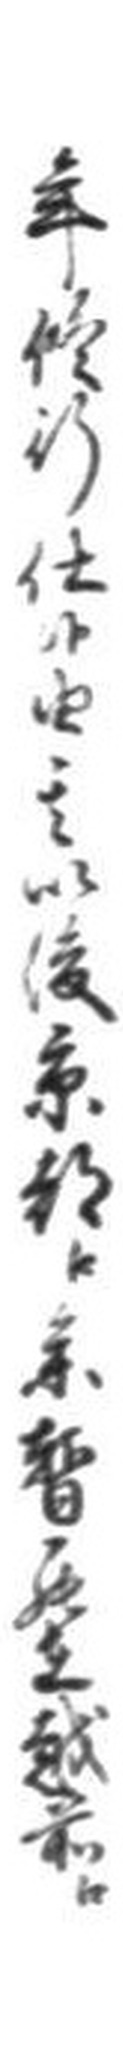年修行仕候由其以後京都江参暫罷在越前江
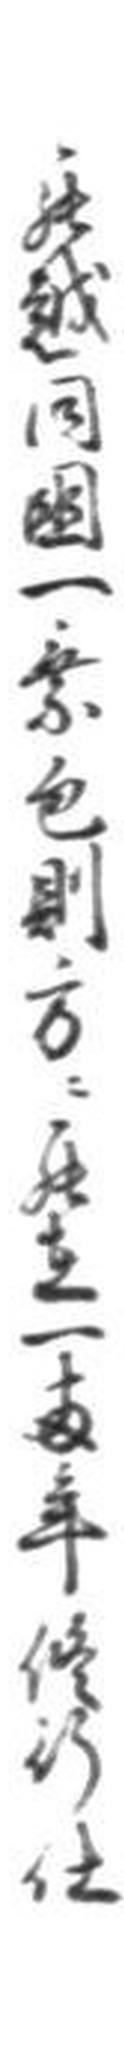罷越同国一乗包則方ニ罷在一両年修行仕
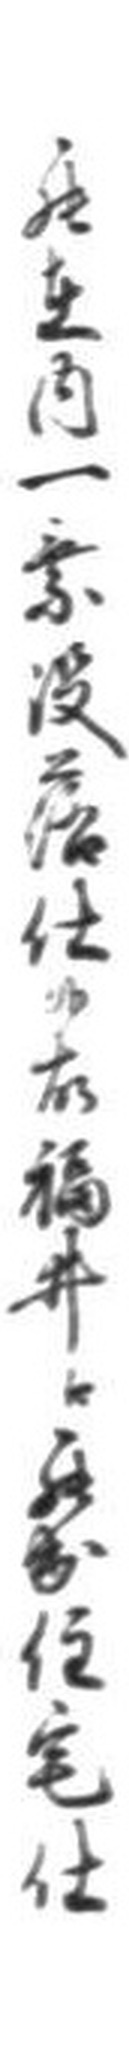罷在内一乗没落仕候故福井江罷出住宅仕
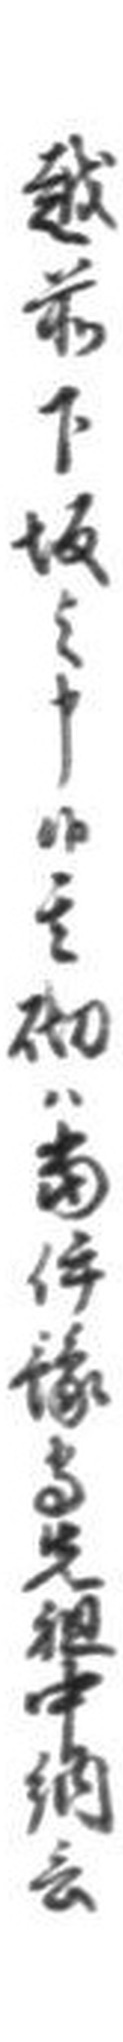越前下坂与申候其砌ハ当伊予守先祖中納言
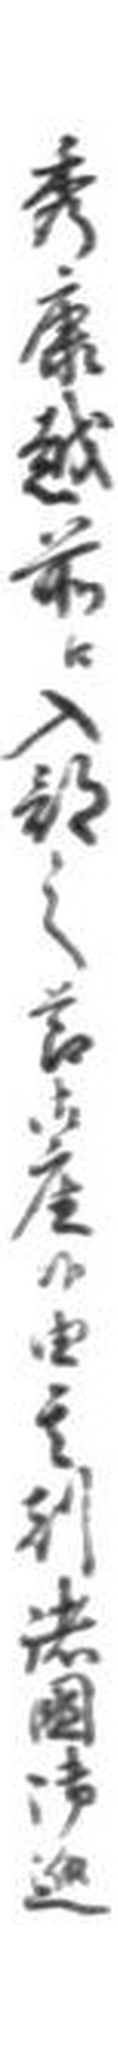秀康越前江入部之節御座候由其刻諸国御巡
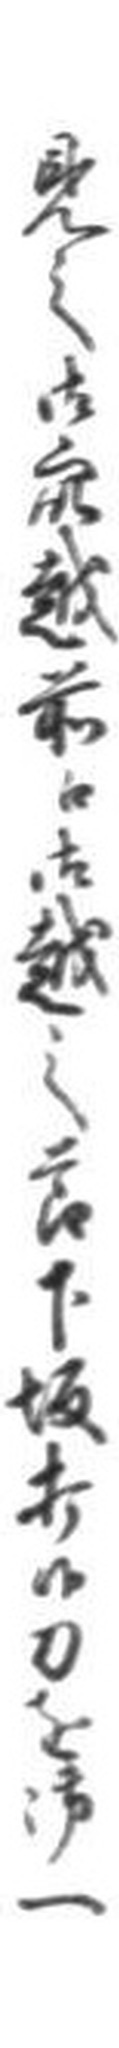見之御衆越前江御越之節下坂打御刀を御一
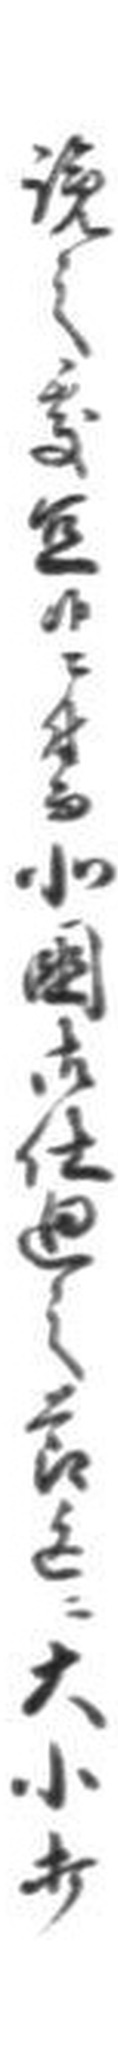覧之処宜候ニ付而北国御仕廻之節迄ニ大小打
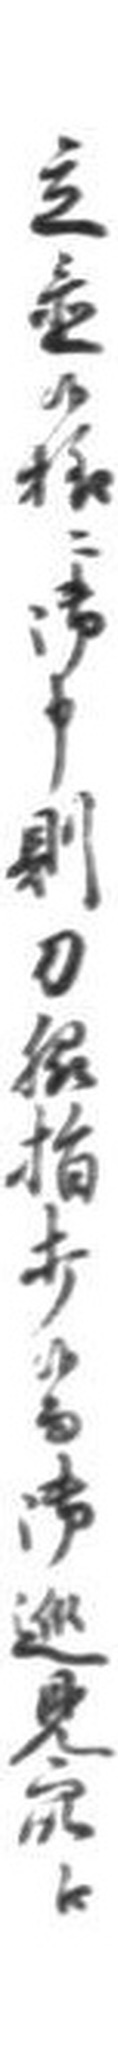立置候様ニ御申則刀脇指打候而御巡見衆江

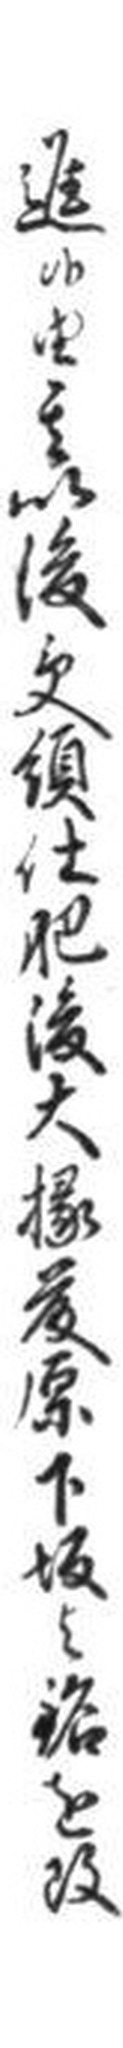進候由其以後受領仕肥後大掾藤原下坂与銘を改
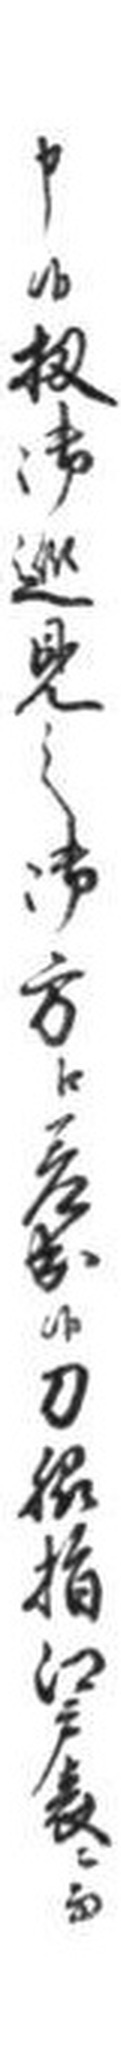申候扨御巡見之御方江差出候刀脇指江戸表ニ而
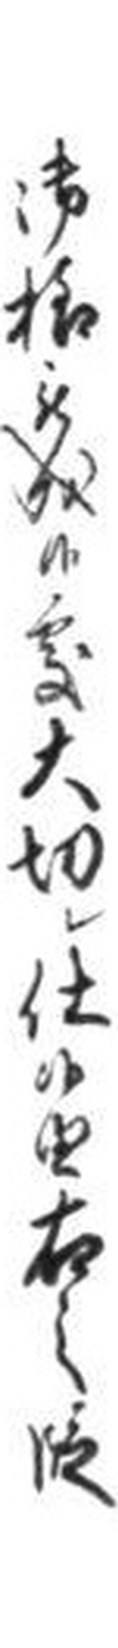御様被成候処大切レ仕候由右之段
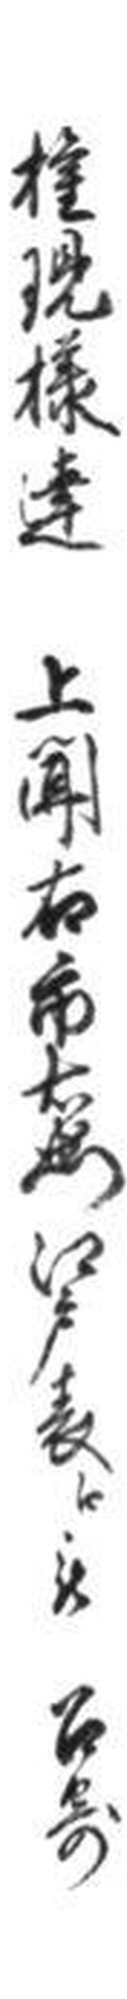権現様達上聞右市右衛門江戸表江被召寄
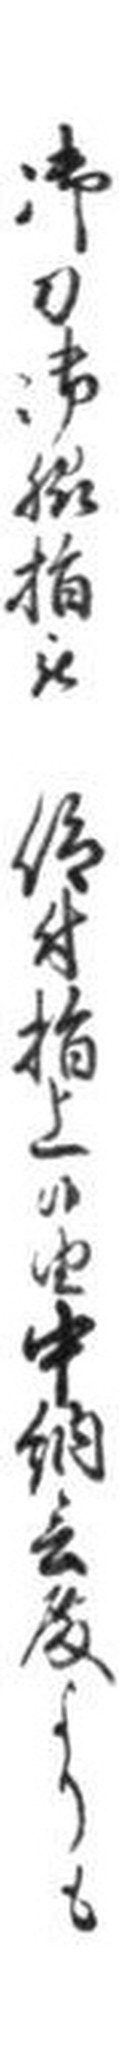御刀御脇指被仰付指上候由中納言殿よりも
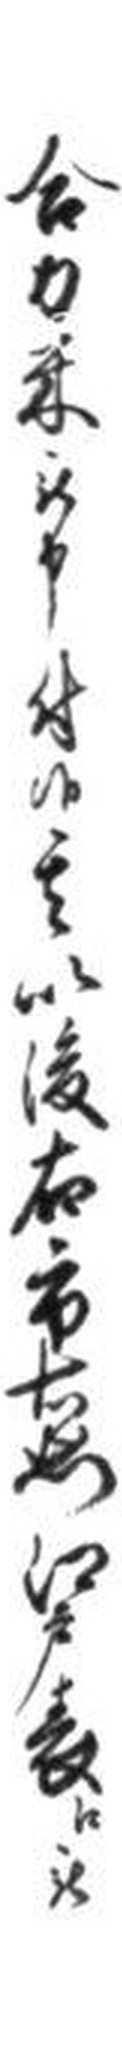合力米被申付候其以後右市右衛門江戸表江被
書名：家譜 三十三 吉邦公 享保四年
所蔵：福井県文書館 Fukui Prefectural Archives
